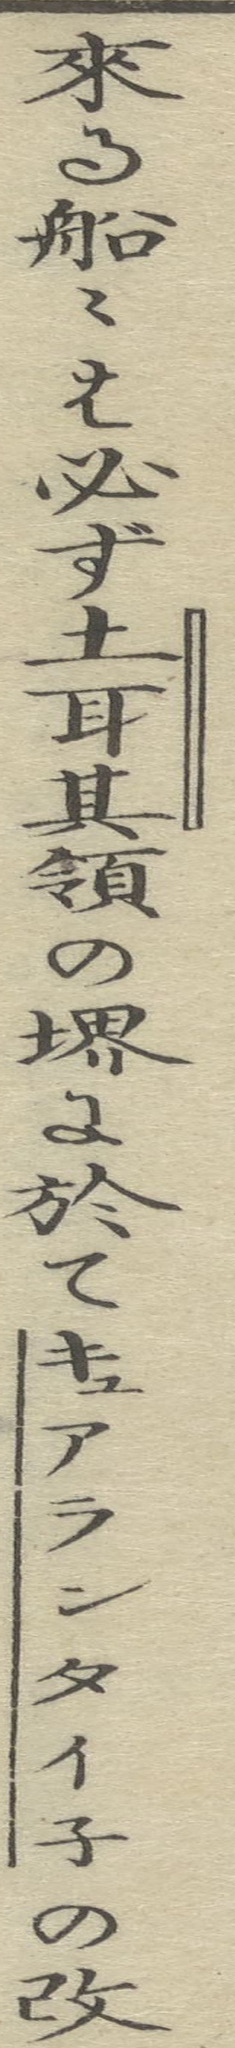來る船々は必ず土耳其領の堺に於てキュアランタイネの改
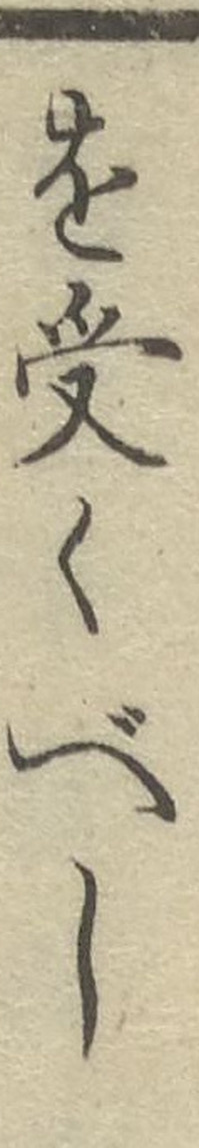を受くべし
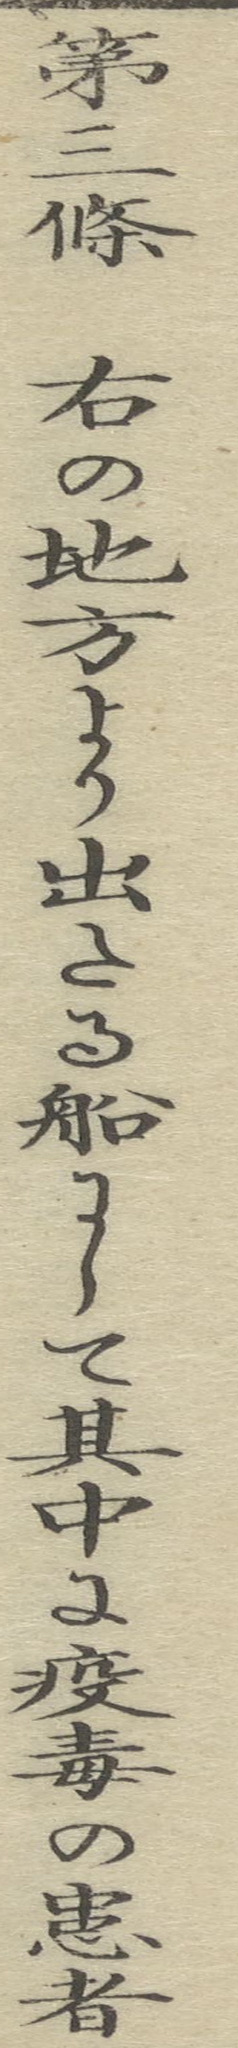第三條右の地方より出たる船にして其中に疫毒の患者
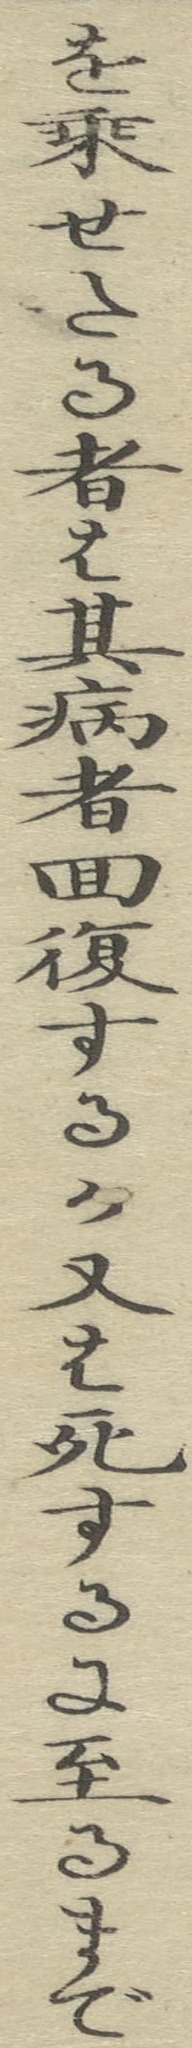を乗せたる者は其病回復するか又は死するに至るまで
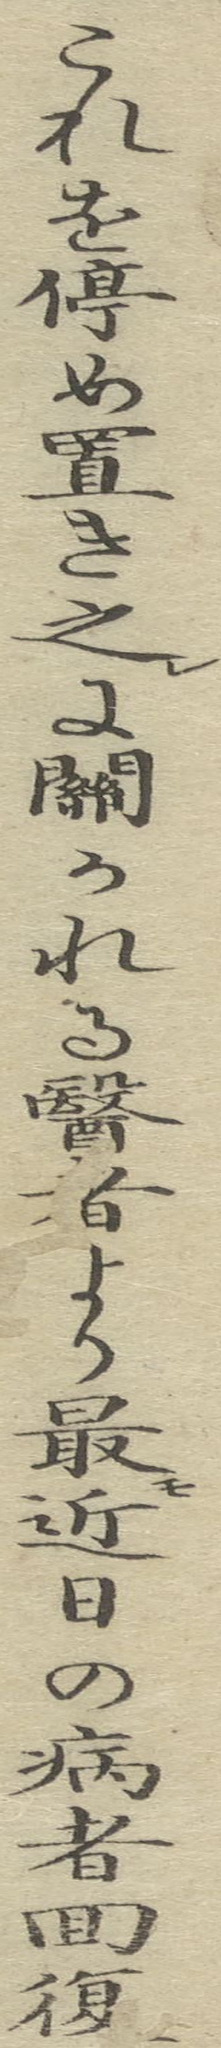これを停め置き之關かれる醫者より最近日の病者回復

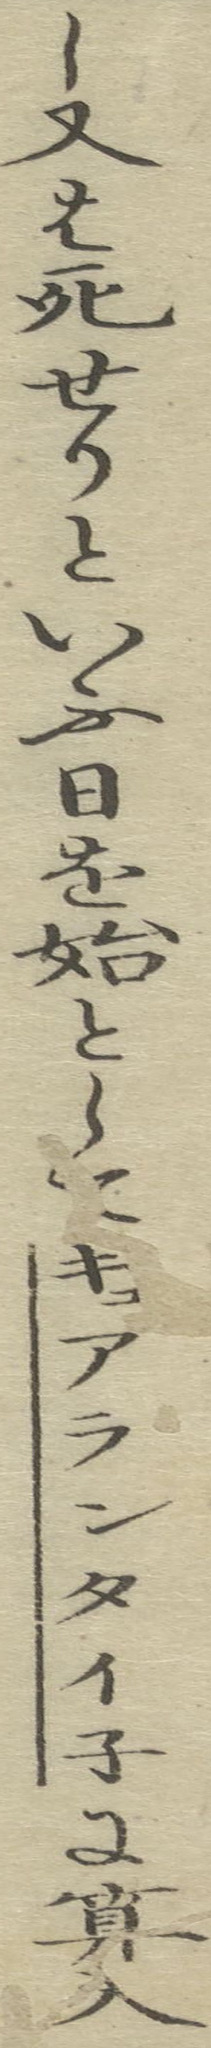し又は死せりといふ日を始としてキュアランタイネに算入
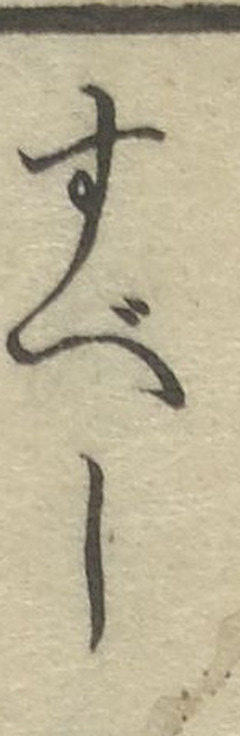すべし
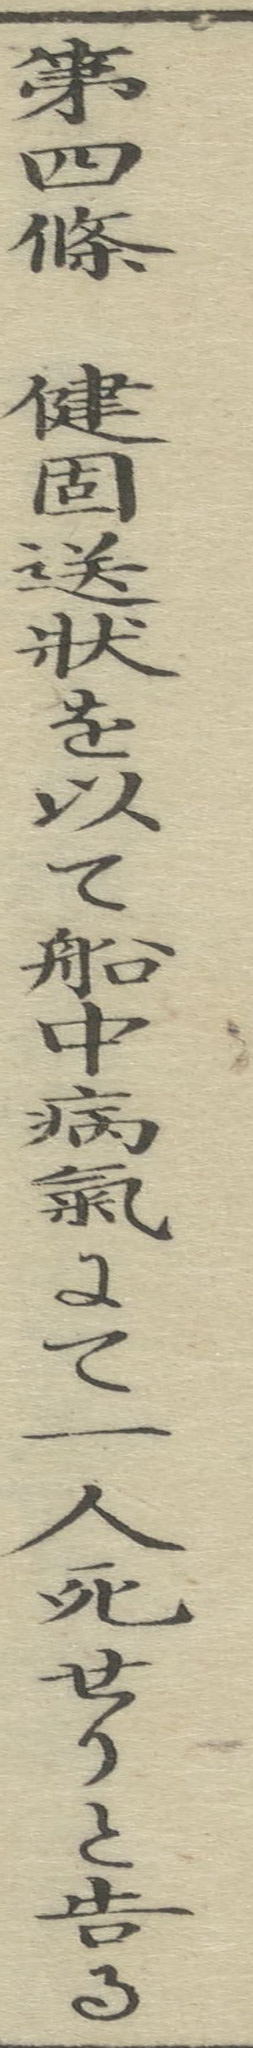第四條健固送状を以て船中病氣にて一人死せりと告る
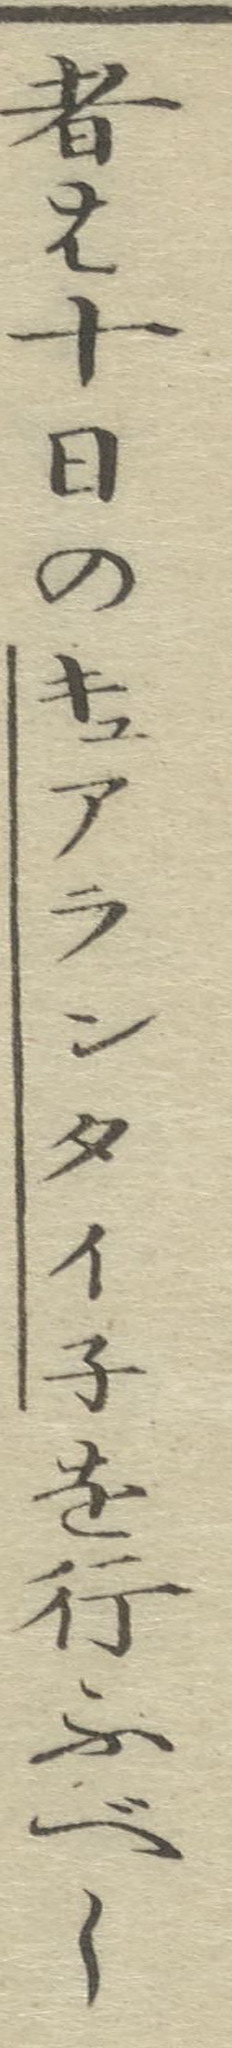者は十日のキュアランタイネを行ふべし
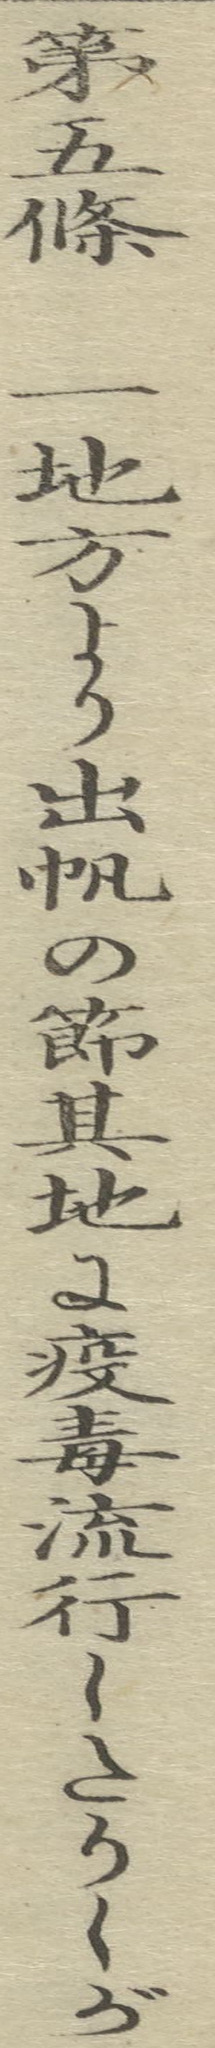第五條一地方より出帆の節其他に疫毒流行したりしが
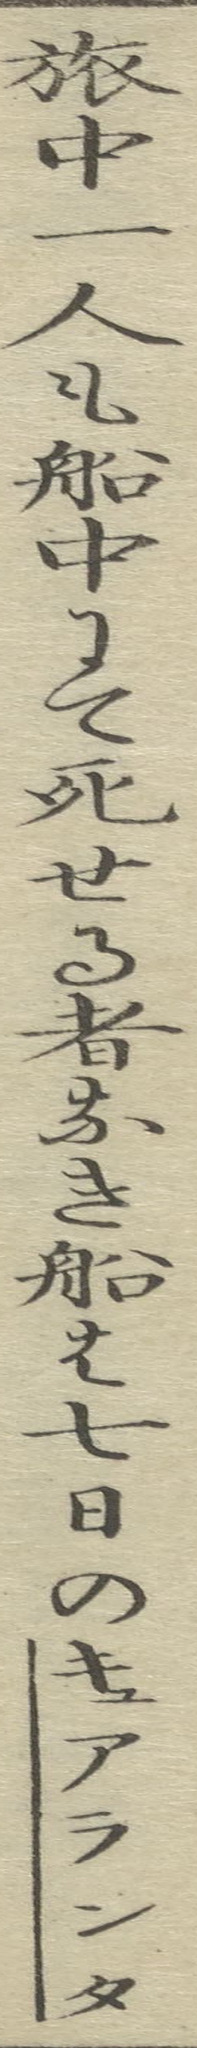旅中一人も船中にて死せる者なき船は七日のキュアランタ
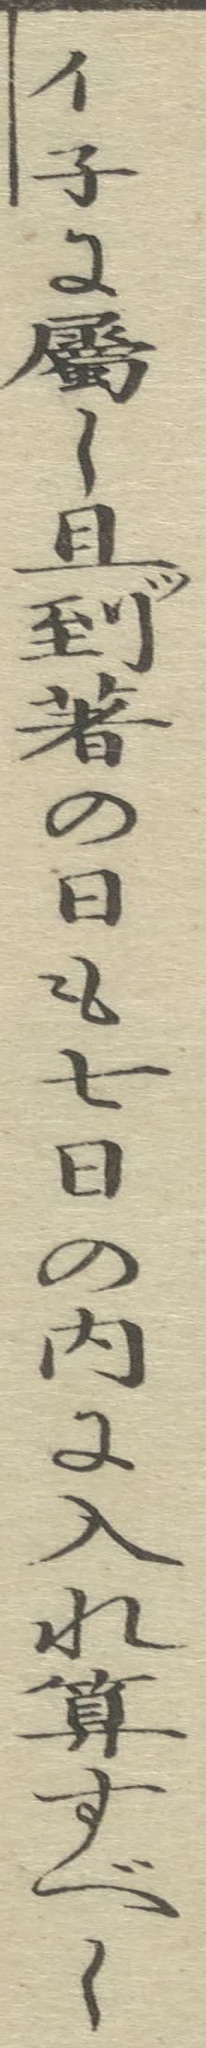イネに屬し且到着の日も七日の内に入れ算すべし
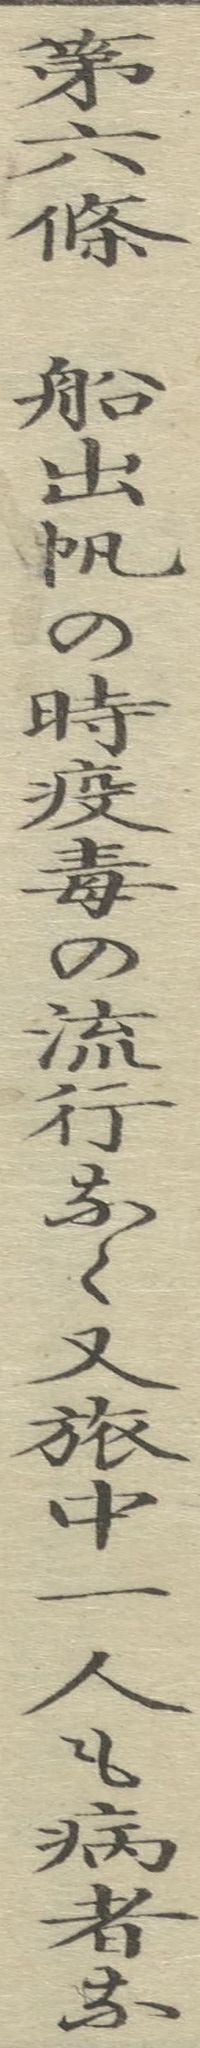第六條船出帆の時疫毒の流行なく又旅中一人も病者な
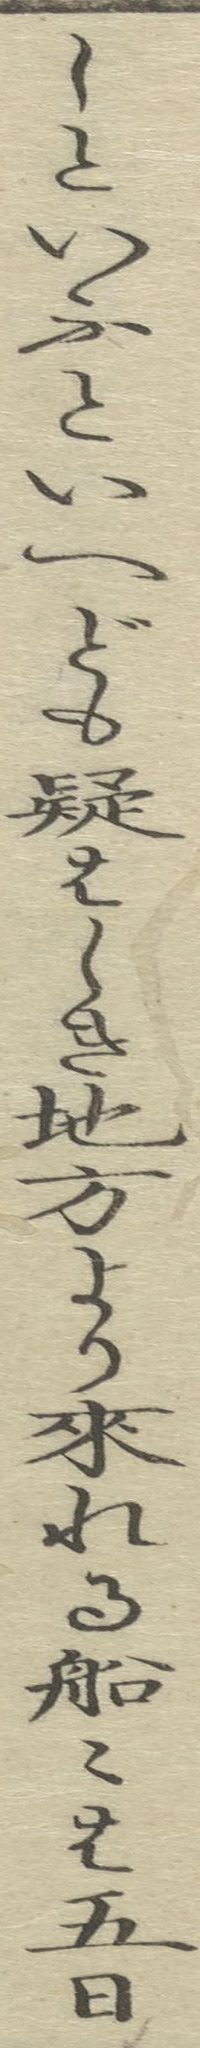しといふといへども疑はしき地方より來れる船々は五日
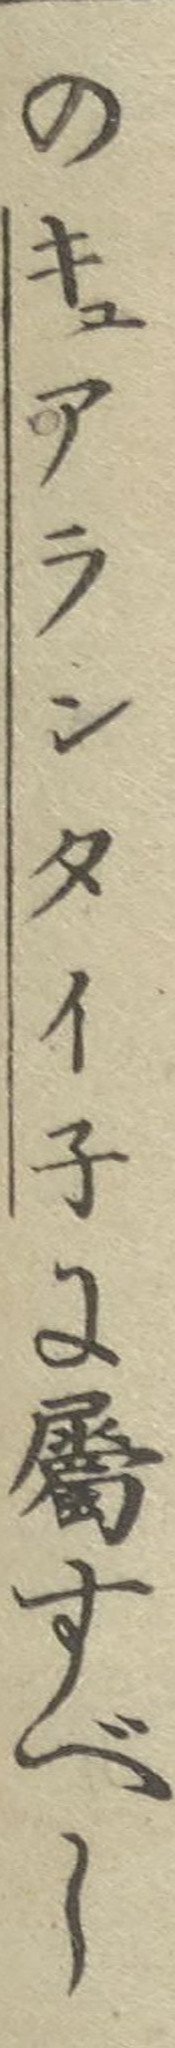のキュアランタイネに屬すべし
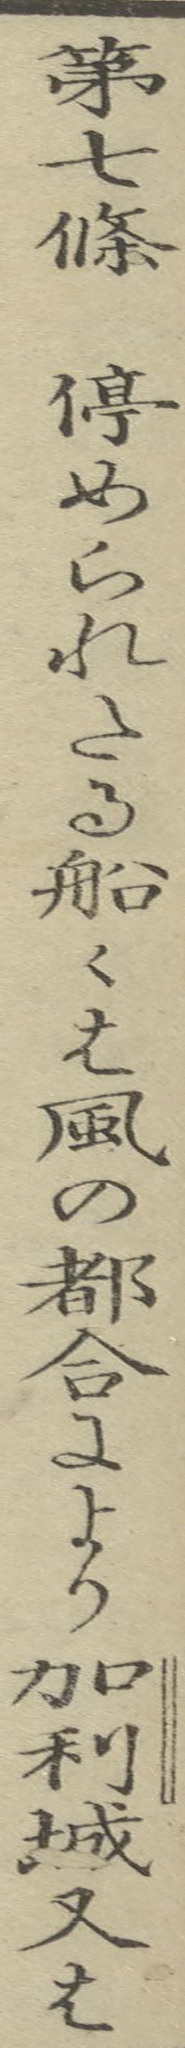第七條停められたる船々は風の都合により加利城又は
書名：官版疫毒預防説　全
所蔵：東京大学総合図書館 General Library in the University of Tokyo, JAPAN
